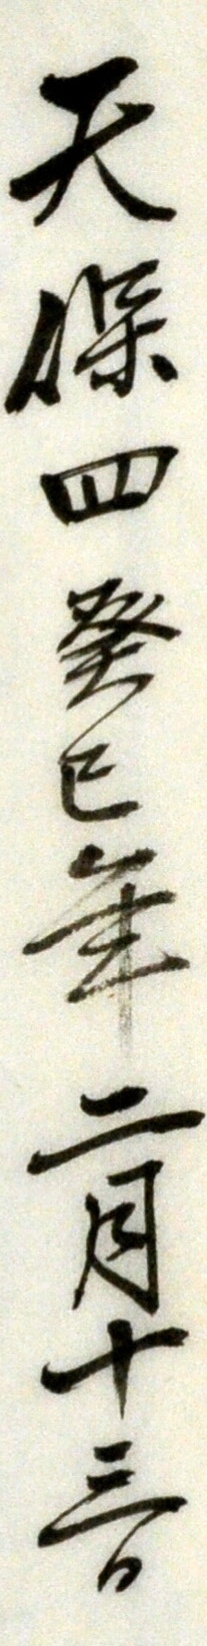天保四癸巳年二月十三日
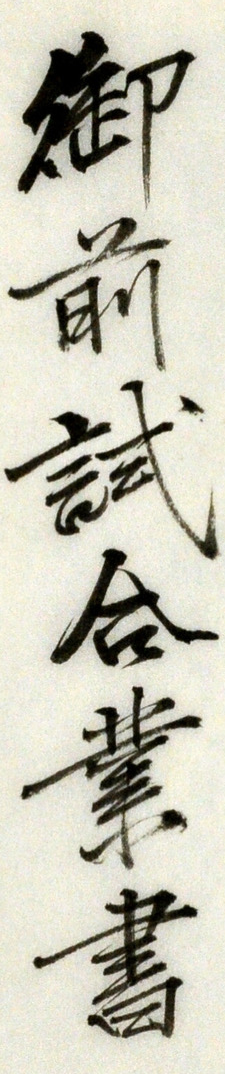御前仕合業書
